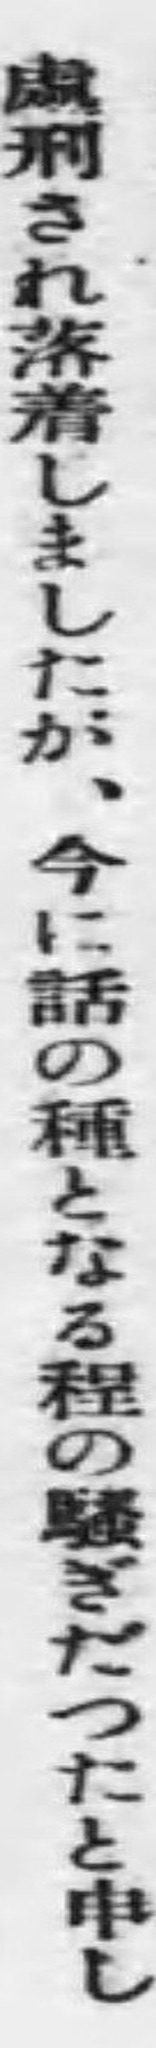處刑され落着しましたが、今に話の種となる程の騒ぎだつたと申し
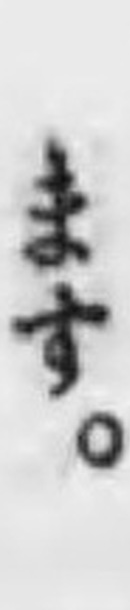ます。
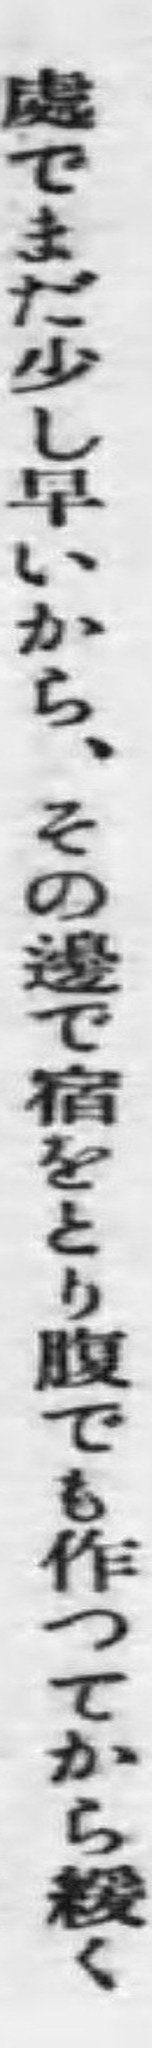處でまだ少し早いから、その邊で宿をとり腹でも作つてから緩く
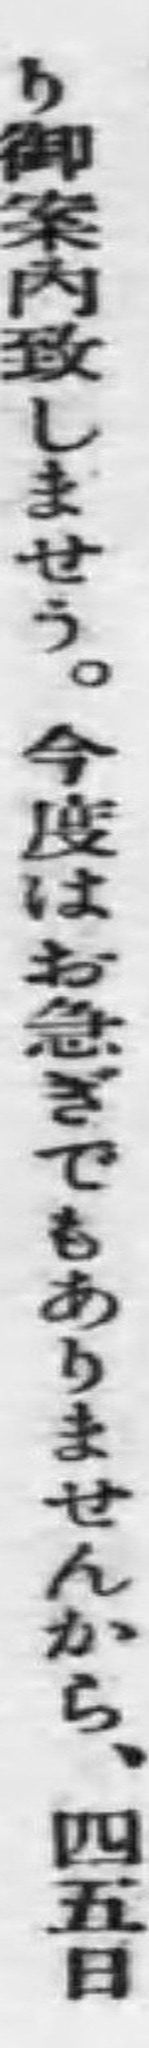り御案内致しませう。今度はお急ぎでもありませんから、四五日
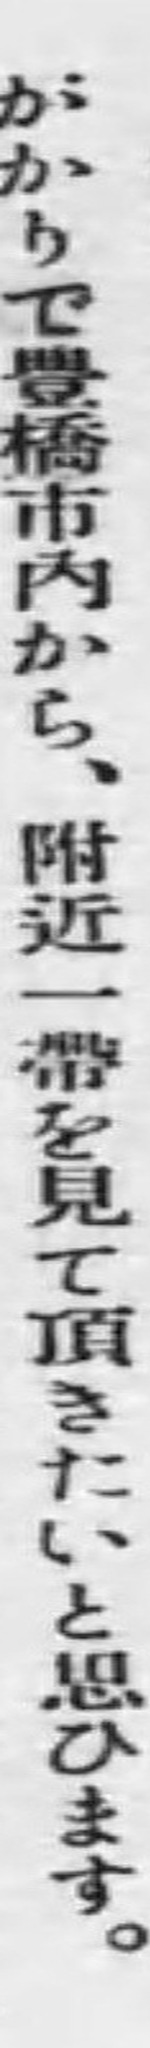がかりで豊橋市内から、附近一帯を見て頂きたいと思ひます。
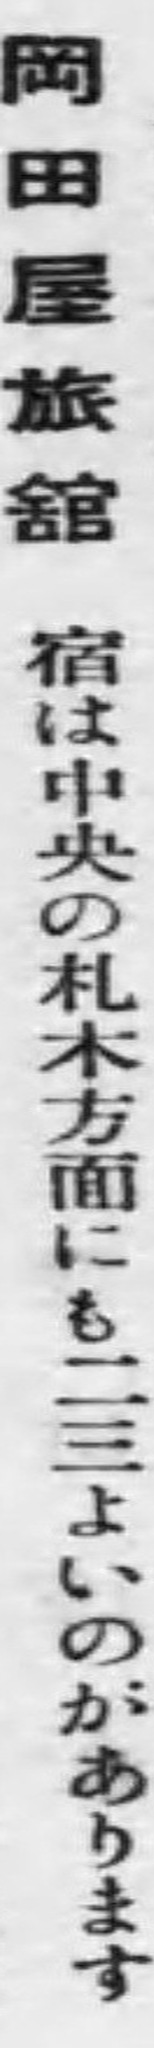岡田屋旅館宿は中央の札木方面にも二三よいのがあります
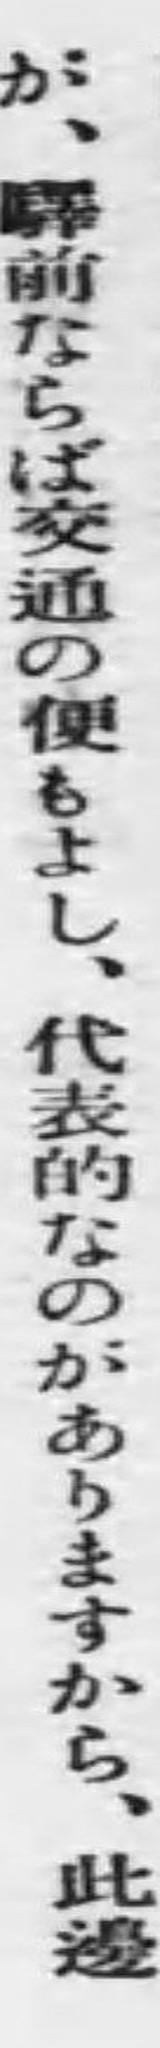が、驛前ならば交通の便もよし、代表的なのがありますから、此邊
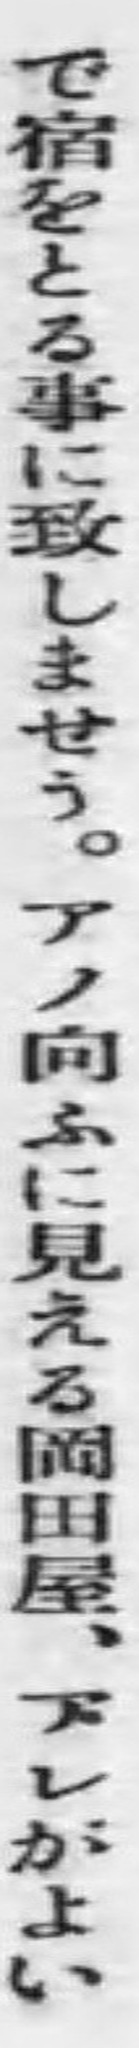で宿をとる事に致しませう。アノ向ふに見える岡田屋、アレがよい
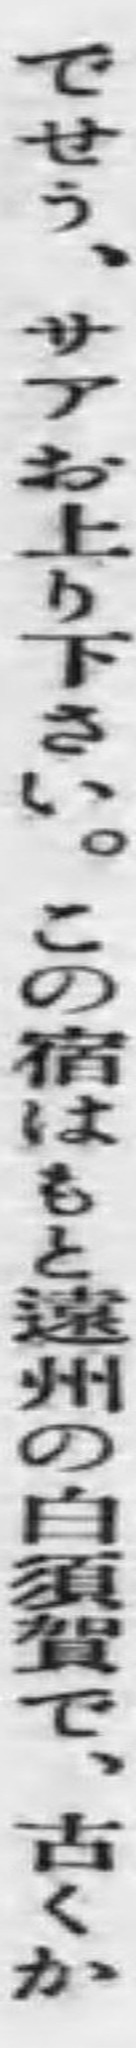でせう、サアお上り下さい。この宿はもと遠州の白須賀で、古くか
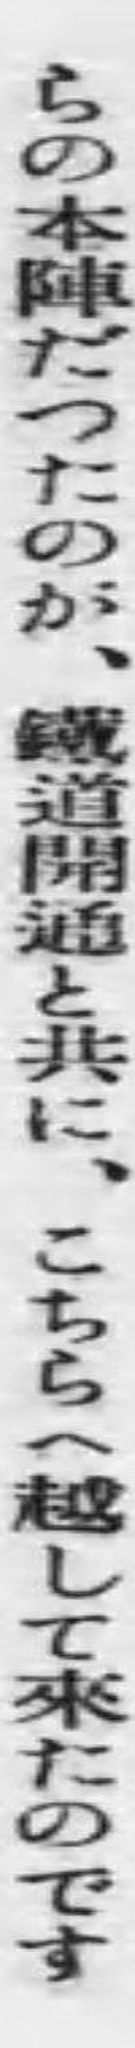らの本陣だつたのが、鐵道開通と共に、こちらへ越して來たのです
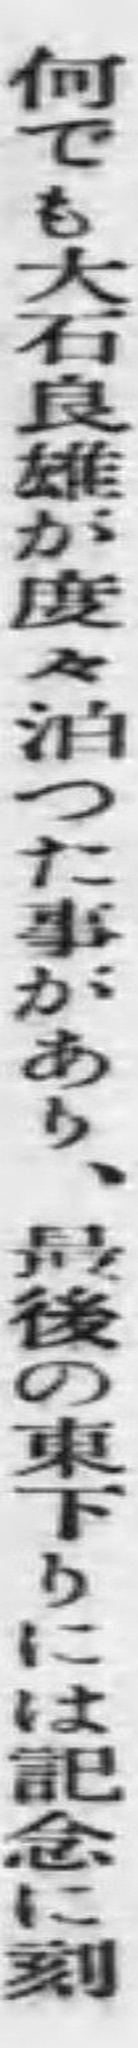何でも大石良雄が度々泊つた事があり、最後の東下りには記念に刻
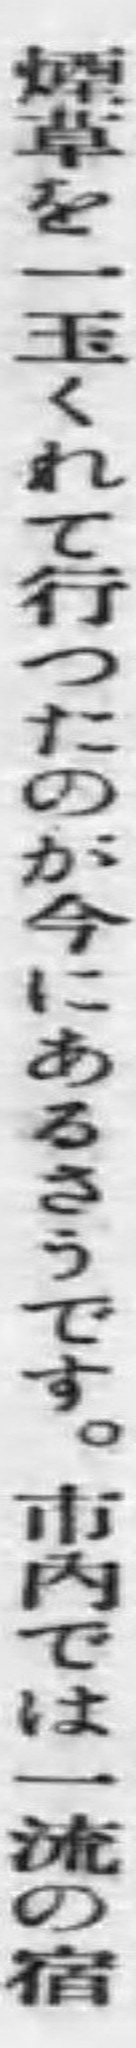煙草を一玉くれて行つたのが今にあるさうです。市内では一流の宿
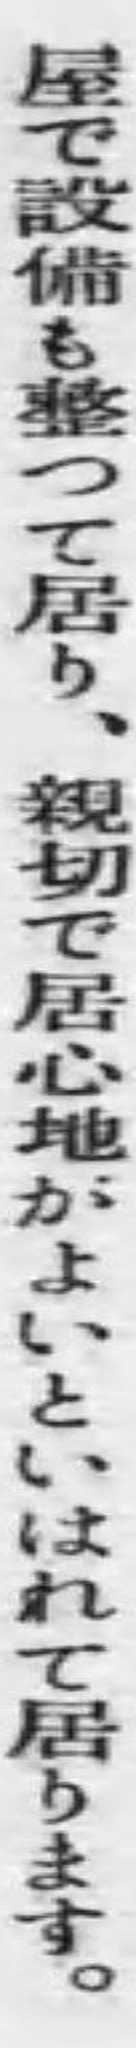屋で設備も整つて居り、親切で居心地がよいといはれて居ります。
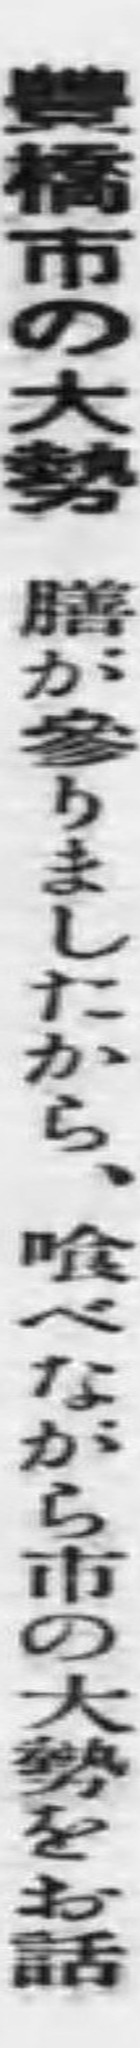豊橋の大勢膳が参りましたから、喰べながら市の大勢をお話
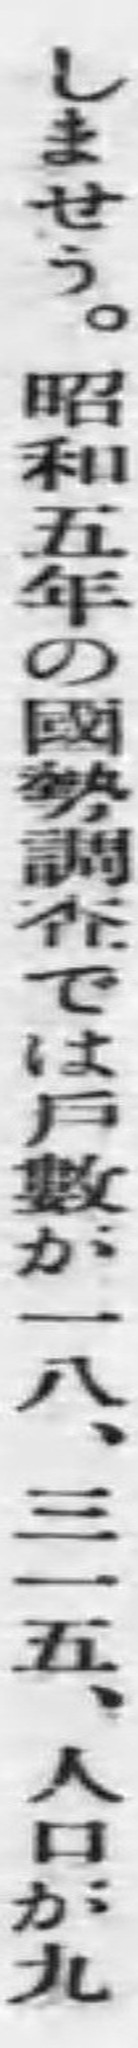しませう。昭和五年の國勢調査では戸数が一八、三一五、人口が九
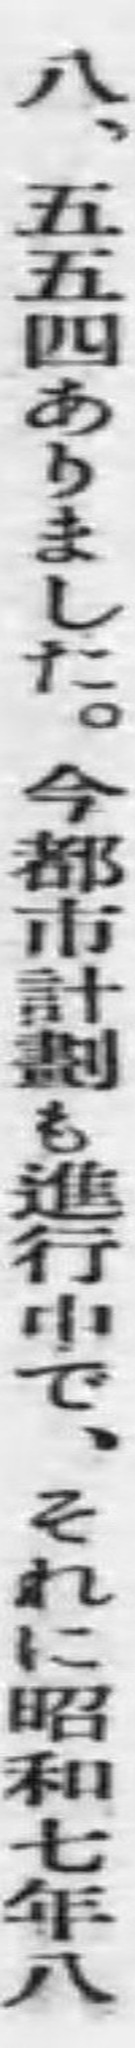八、五五四ありました。今都市計劃も進行中で、それに昭和七年八
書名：東三河道中記 : 豊橋市及其附近案内
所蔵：国立国会図書館 National Diet Library, JAPAN
